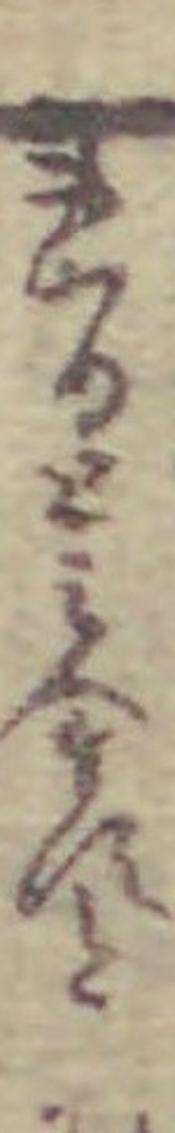れるとみへますと
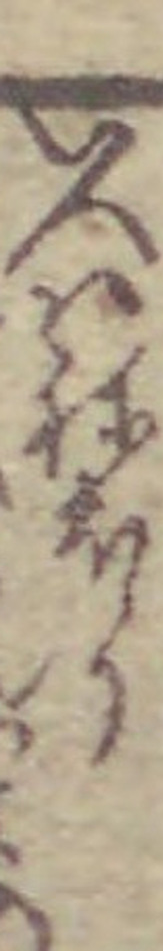いへはねほう
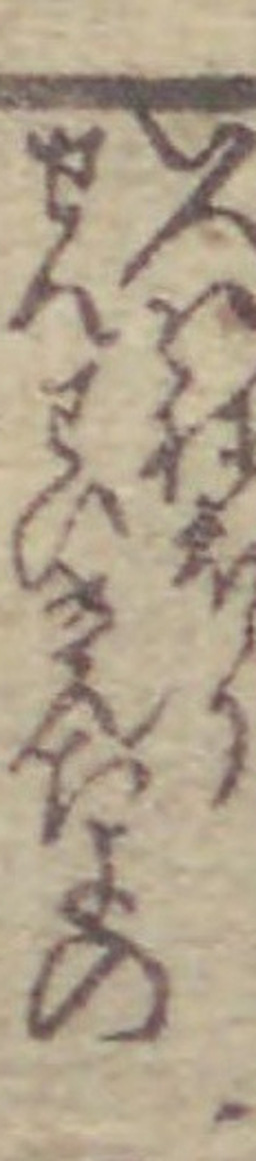せんせいきんちよの
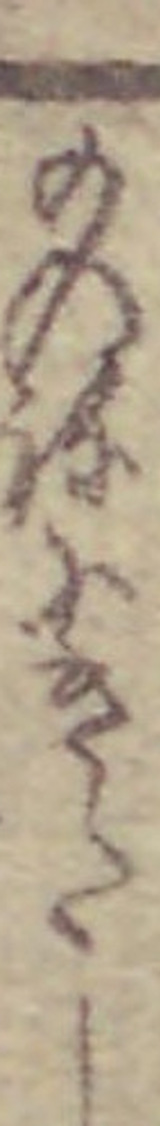ものねにきた
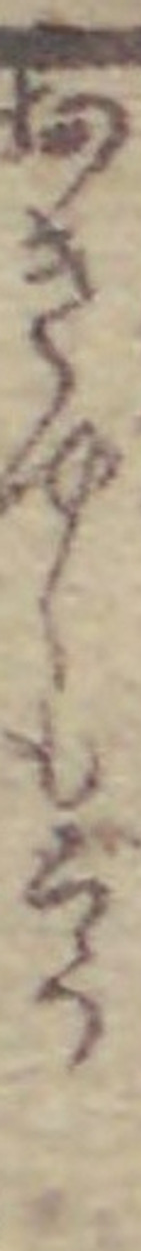おきやくもどう
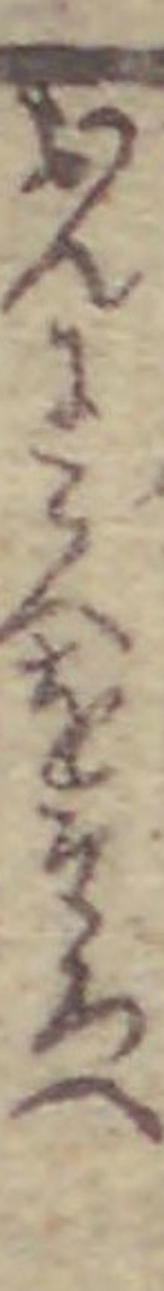おんにこへをそろへ
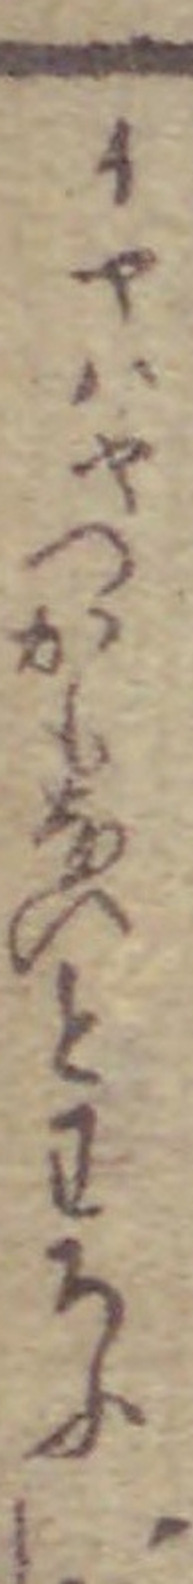イヤハヤつかもないとわろふ

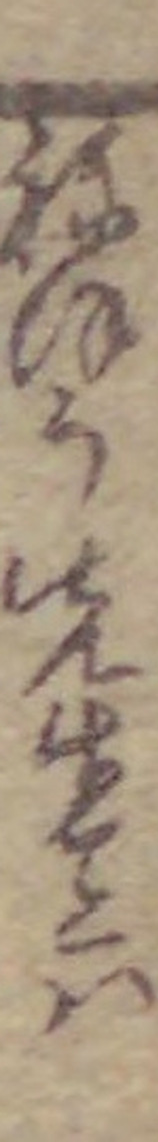ねほう先生とは
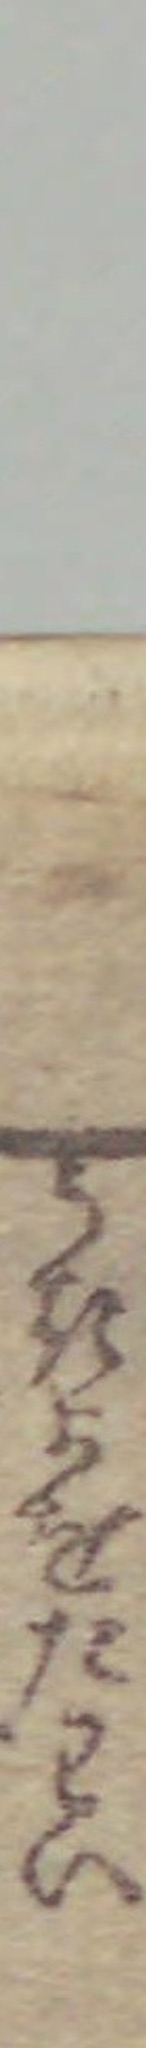うきよをたわい
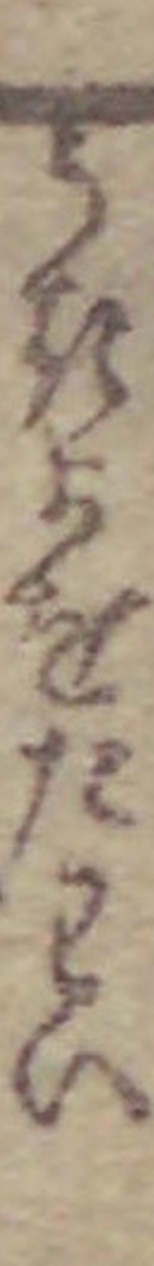うきよをたわい
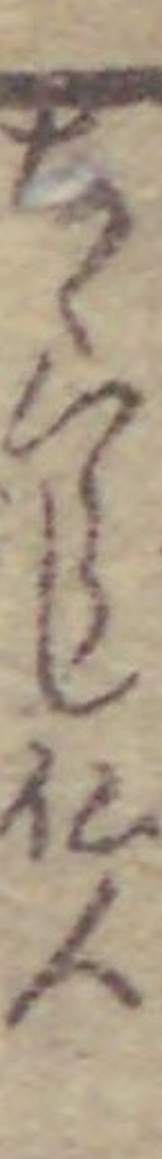なくくらし仙人
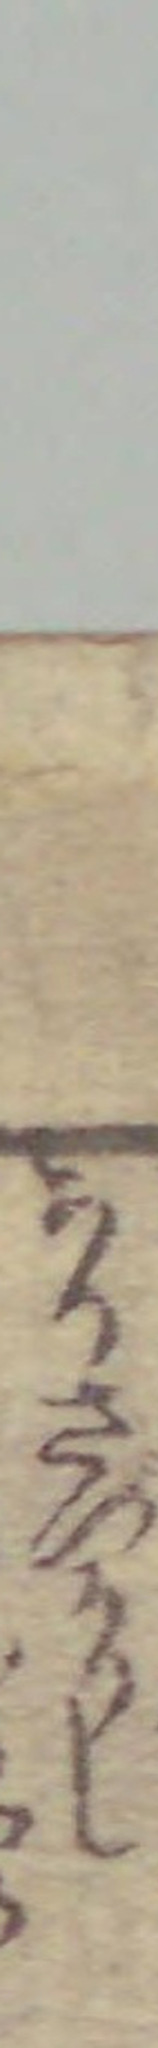よりさづかりし
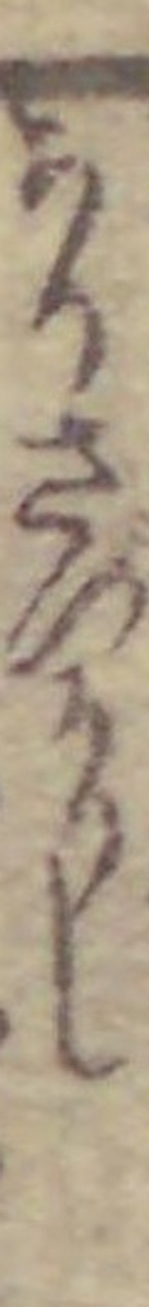よりさづかりし
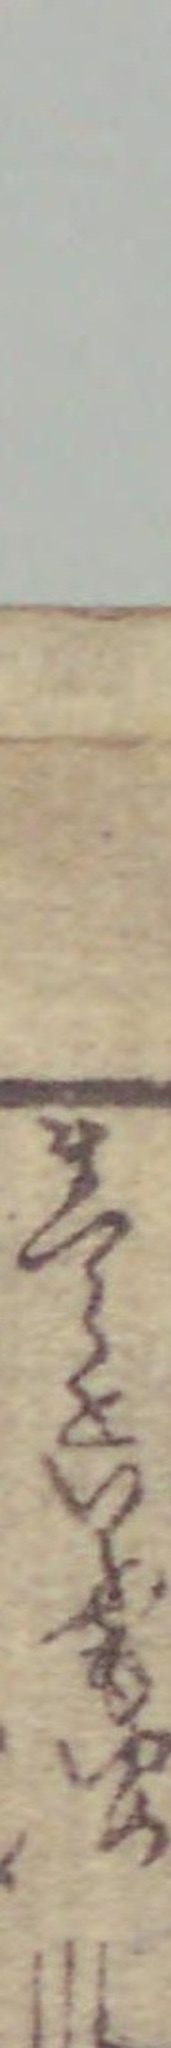まくらといふもゆめ
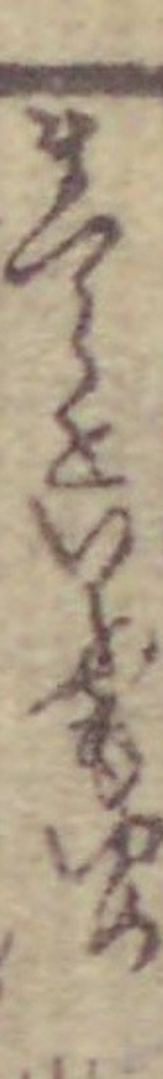まくらといふもゆめ
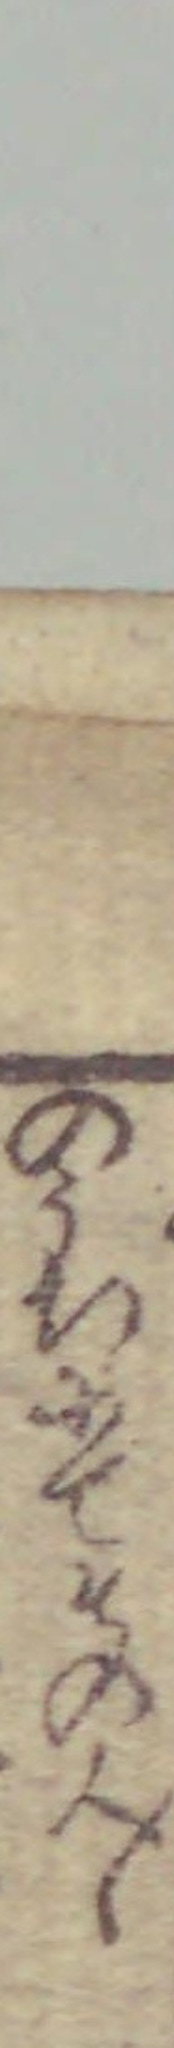のうちにてその人〳〵
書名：思事夢濃枕 3巻
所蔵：国立国会図書館 National Diet Library, JAPAN
